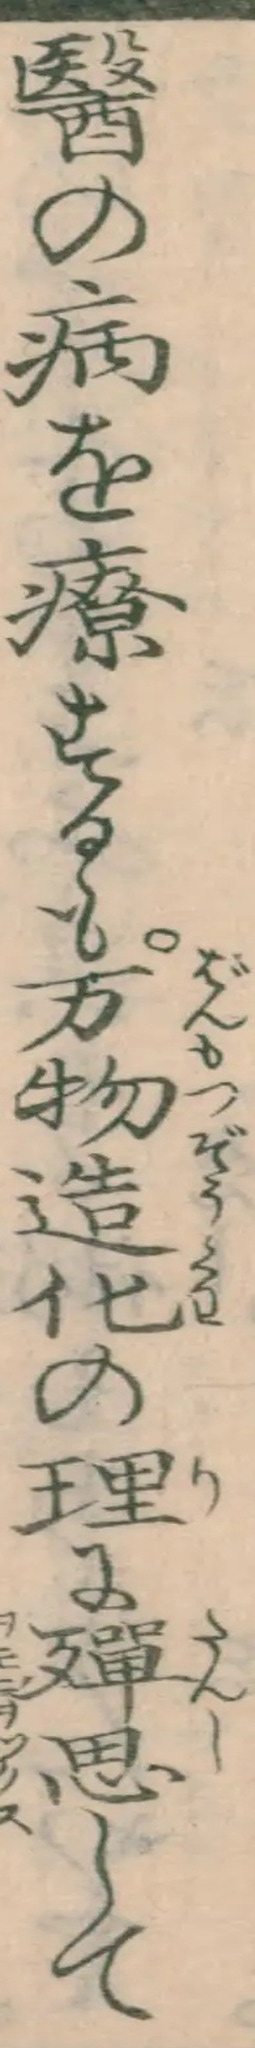醫の病を療するも。万物造化の理に殫思して
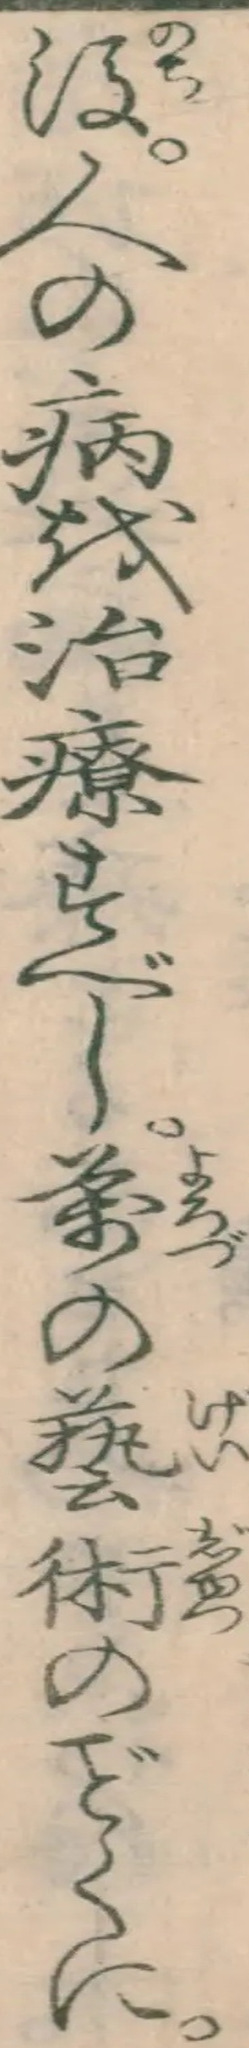後。人の病を治療すべし。萬の藝術のごとくに。
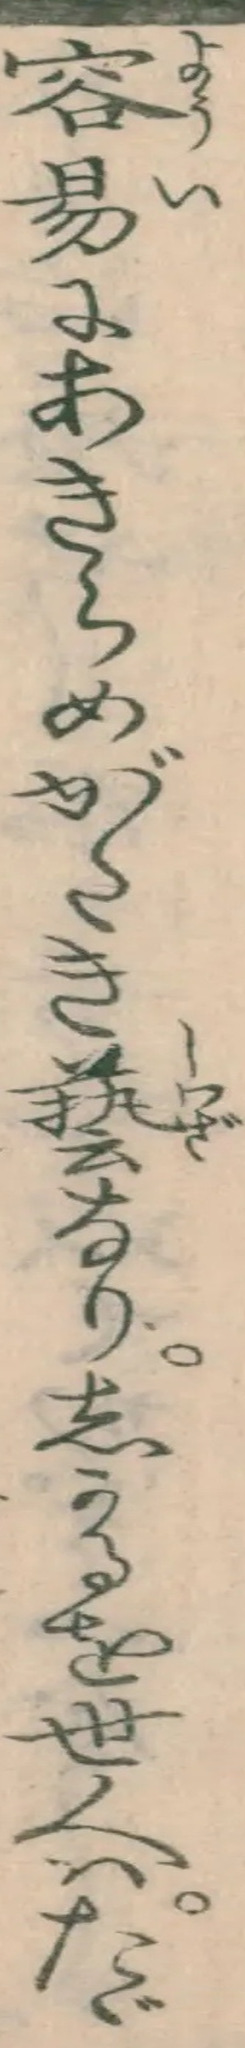容易にあきらめがたき藝なり。しかるを世人は。たゞ
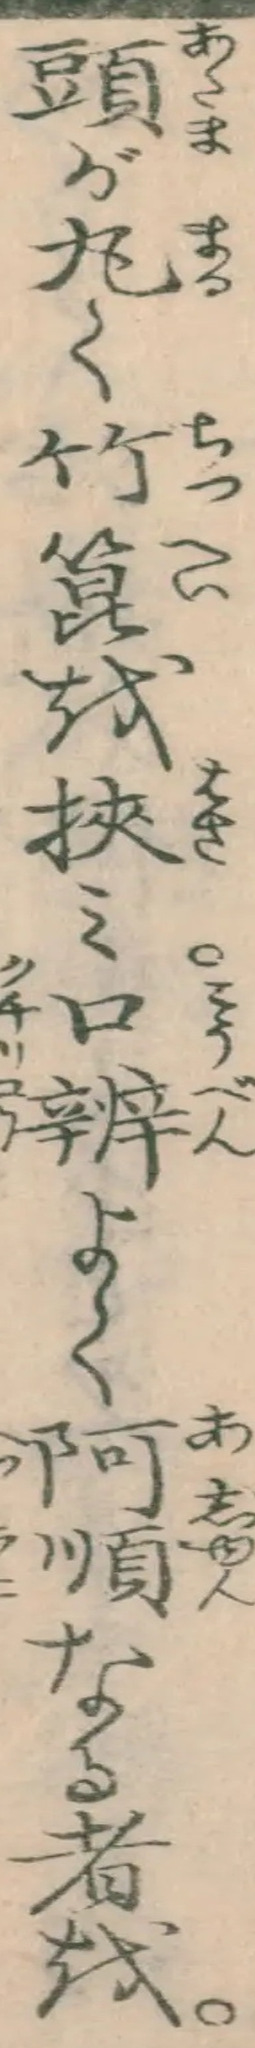頭が丸く竹箟を挾み。口辨よく阿順なる者を。
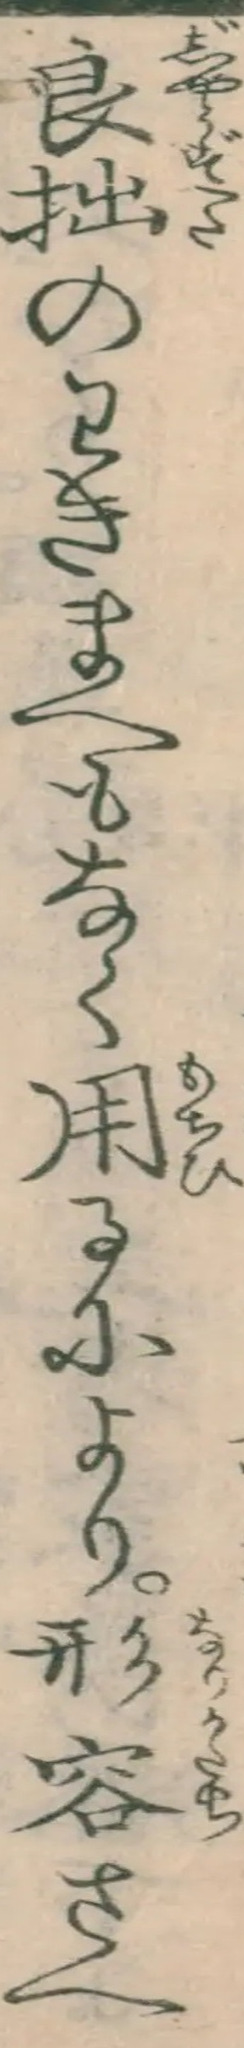良拙のわきまへもなく用るにより。形容さへ
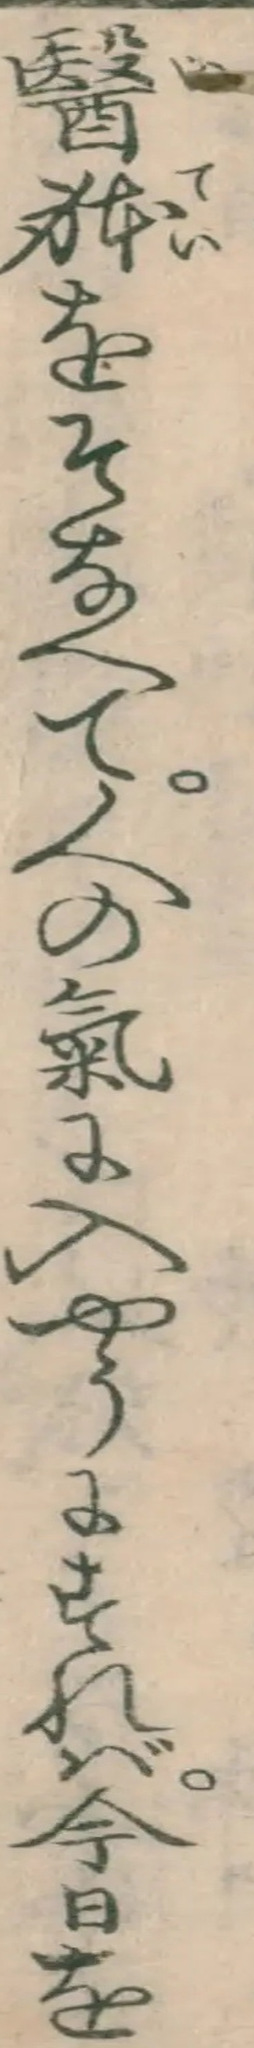醫体をそなへて。人の氣に入やうにすれば。今日を
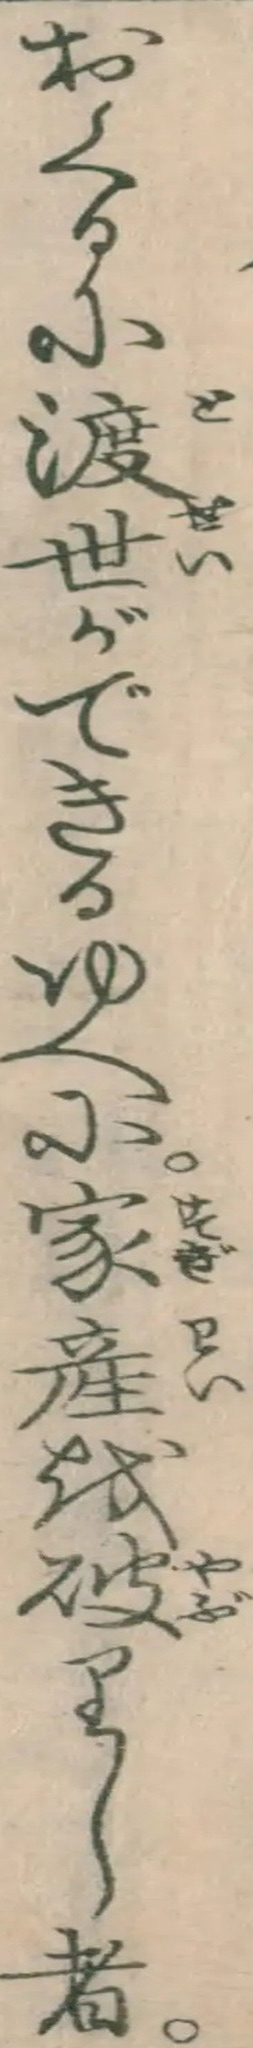おくるに渡世ができるゆへに。家産を破りし者。

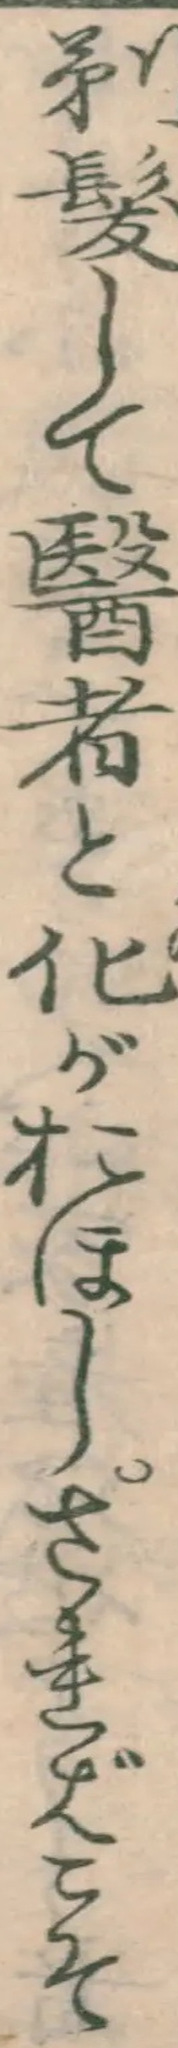剃髪して醫者と化がおほし。さればこそ
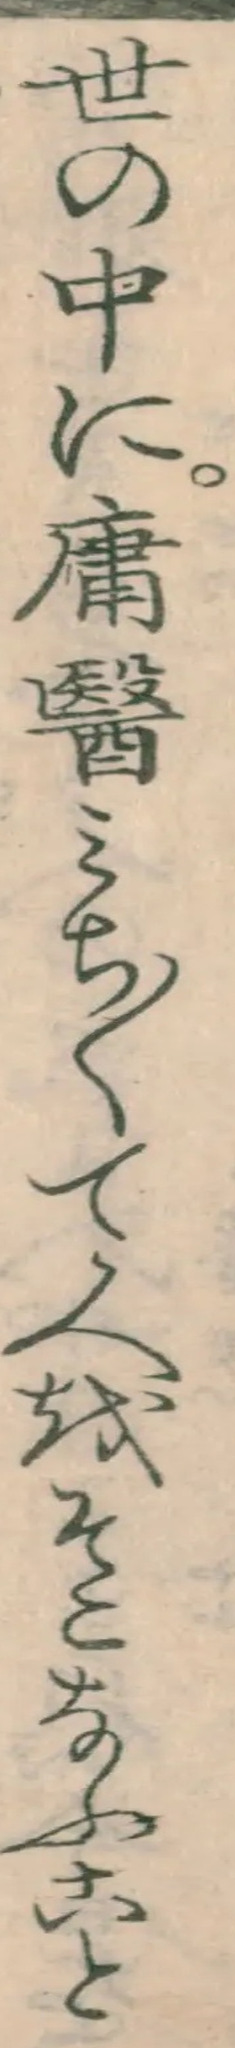世の中に。庸醫みち〳〵て人をそこなふこと
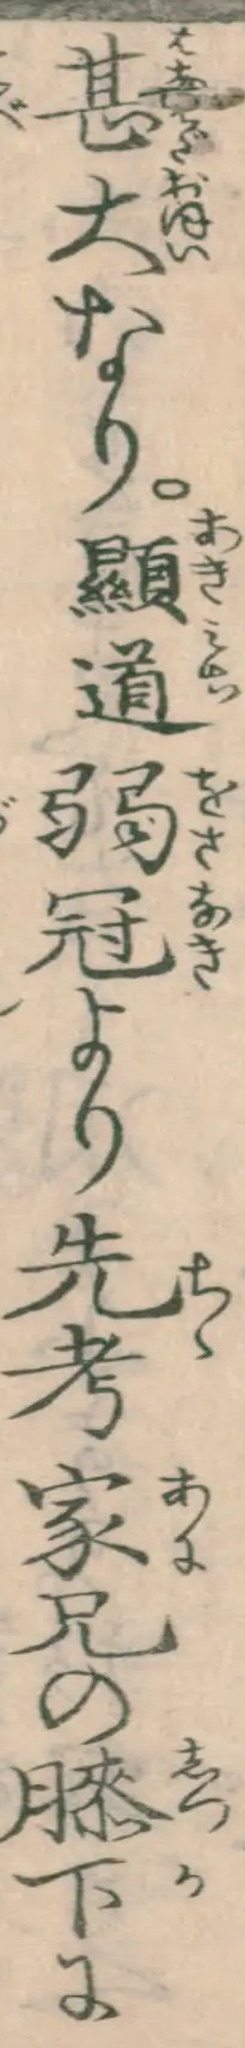甚大なり。顯道弱冠より先考家兄の膝下に
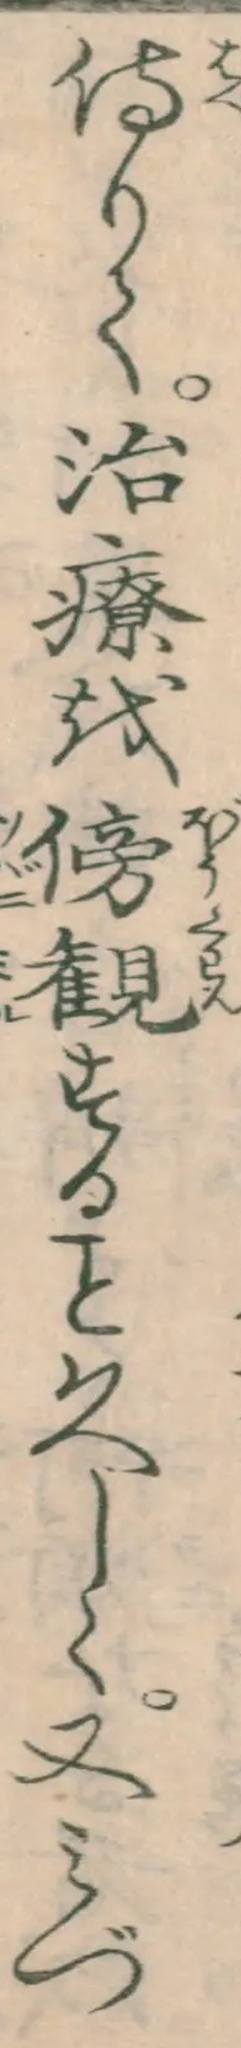侍りて。治療を傍観すること久しく。又みづ
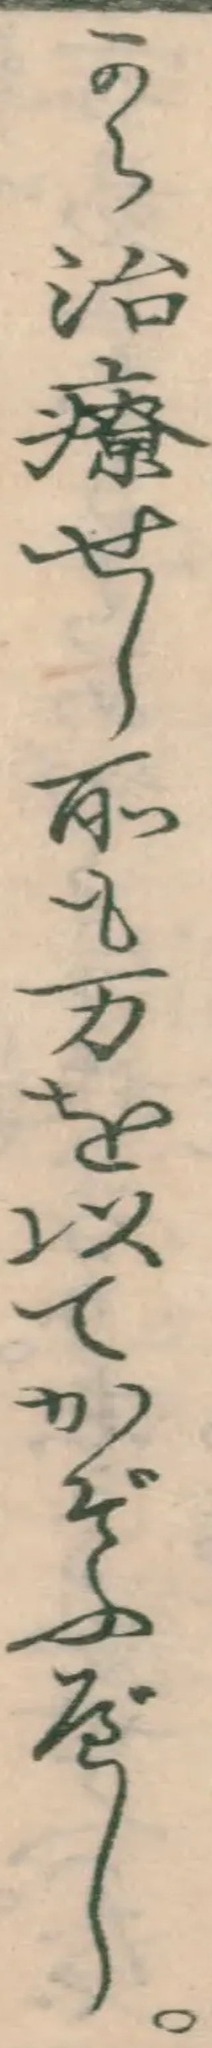から治療せし所も万を以てかぞふべし。
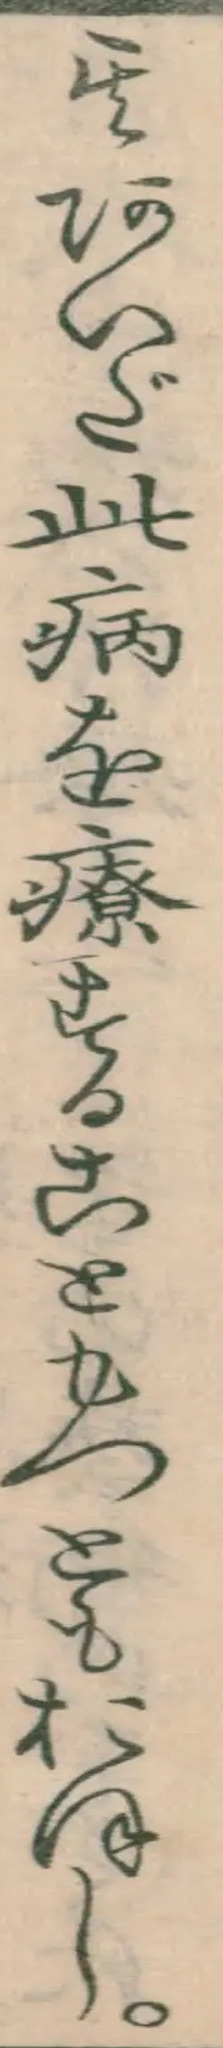其あいだ此病を療することもつともおほし。
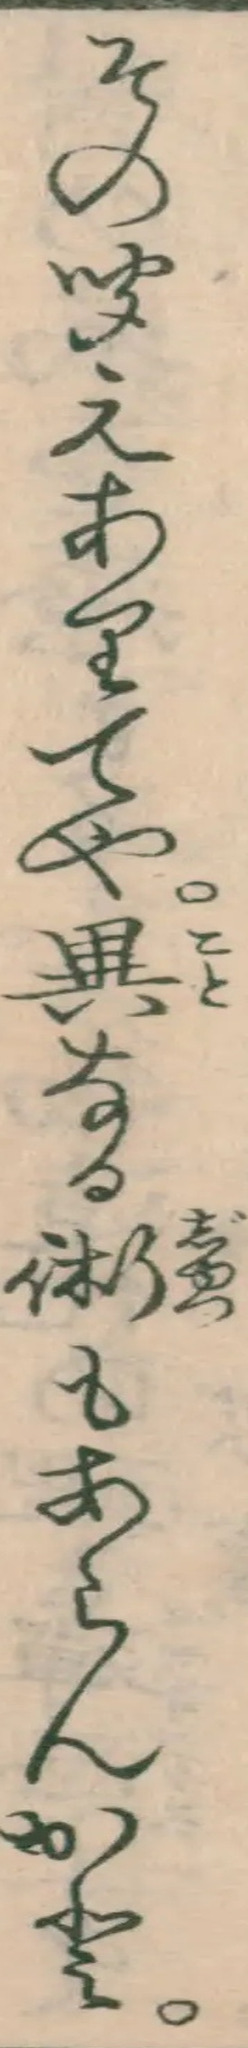その聞えありてや。異なる術もあらんかと。
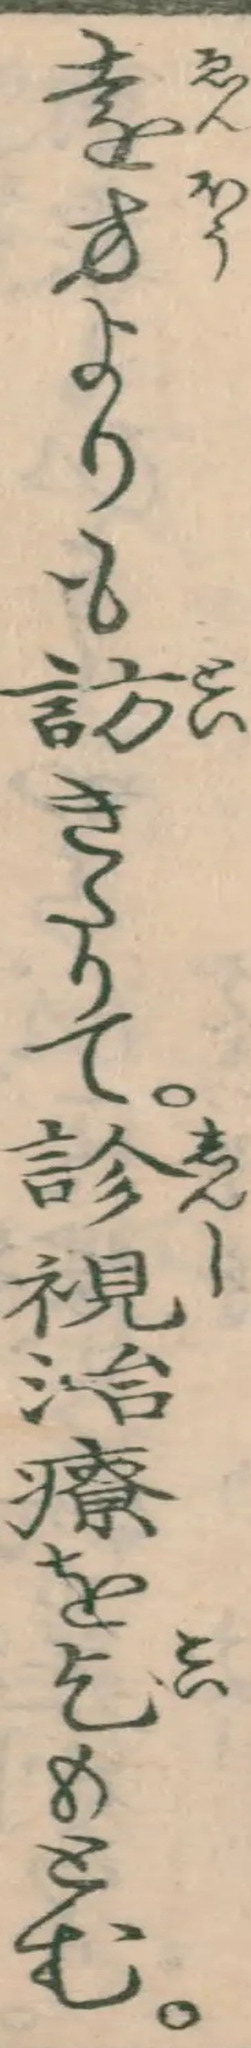遠方よりも訪きたりて。診視治療を乞もとむ。
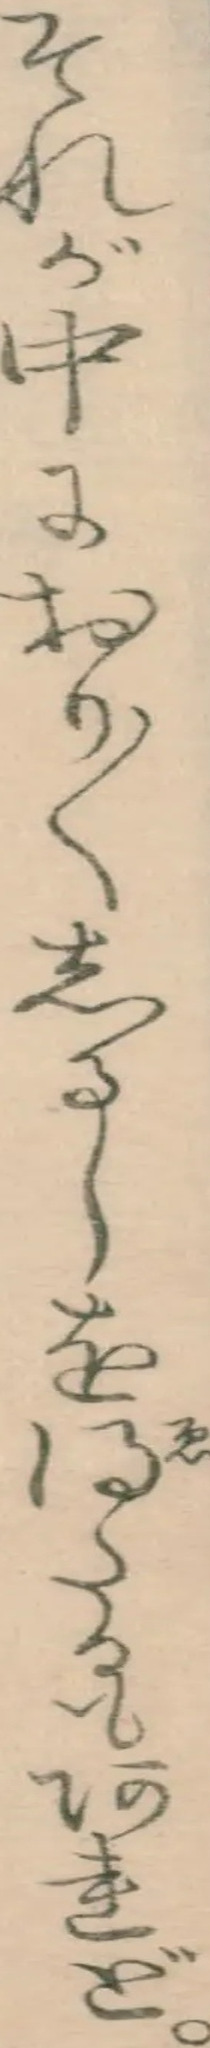それが中におり〳〵しるしを得たるもあれど。
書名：瘡家示訓
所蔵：国立国会図書館 National Diet Library, JAPAN
